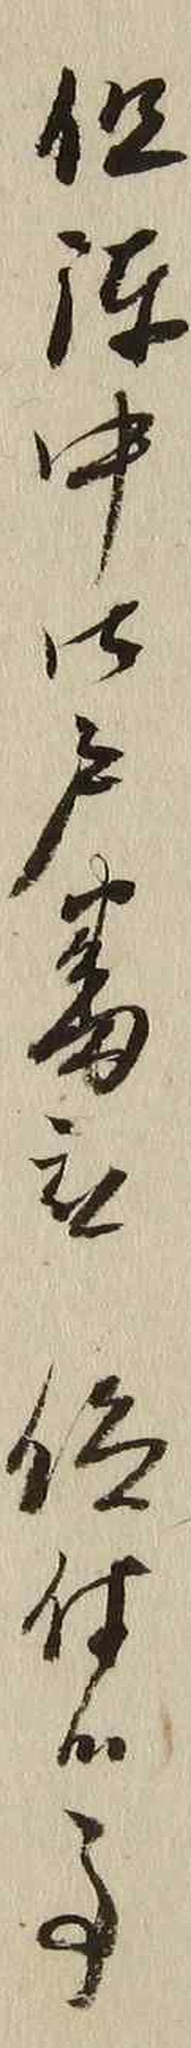但陳中御戸番被仰付候事
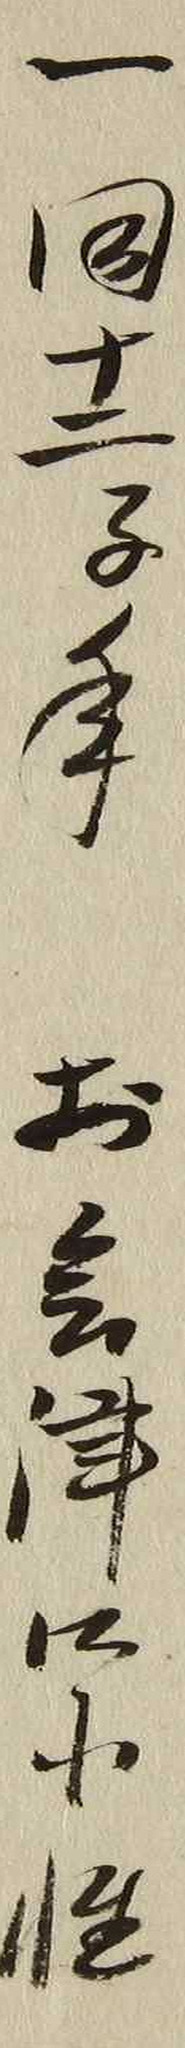一同十二子年於会津御小性
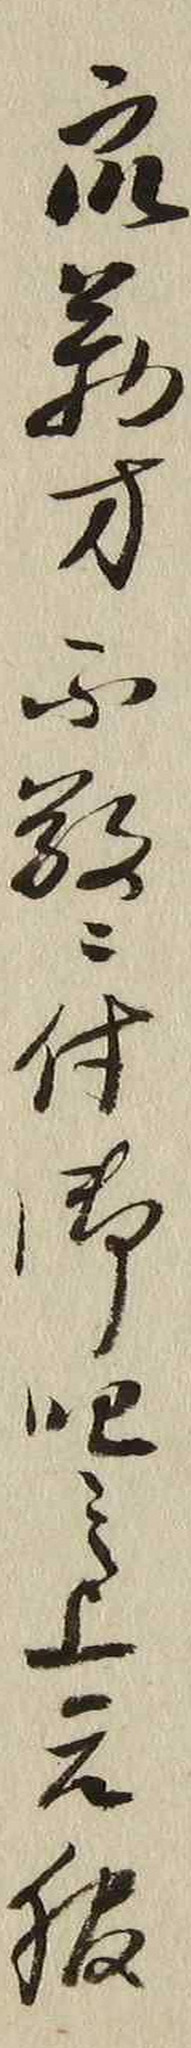衆勤方不敬ニ付御叱之上元服
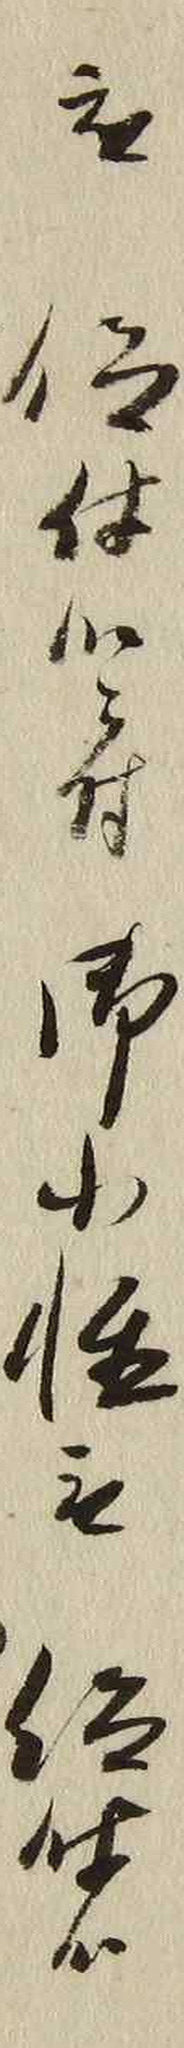被仰付候ニ付御小性被仰付候
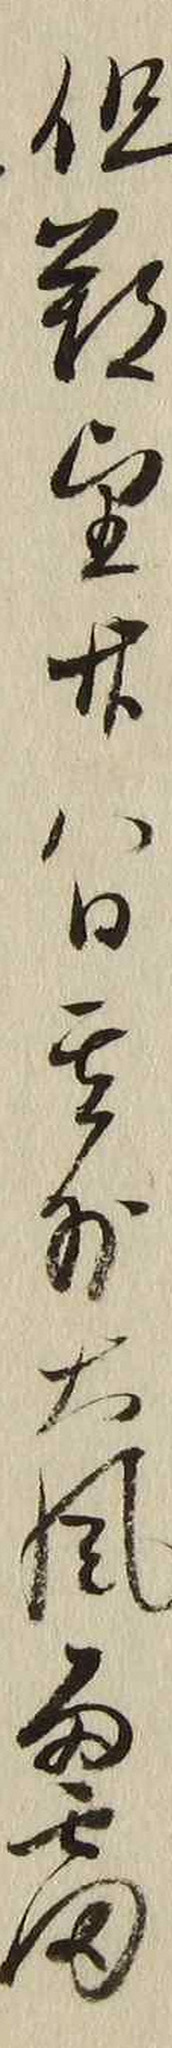但朔望廿八日其外大風雨雷
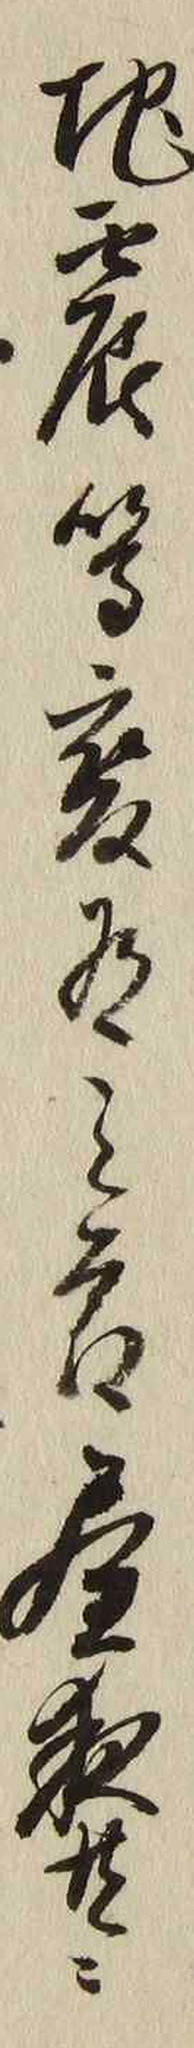地震等変有之節昼夜共ニ
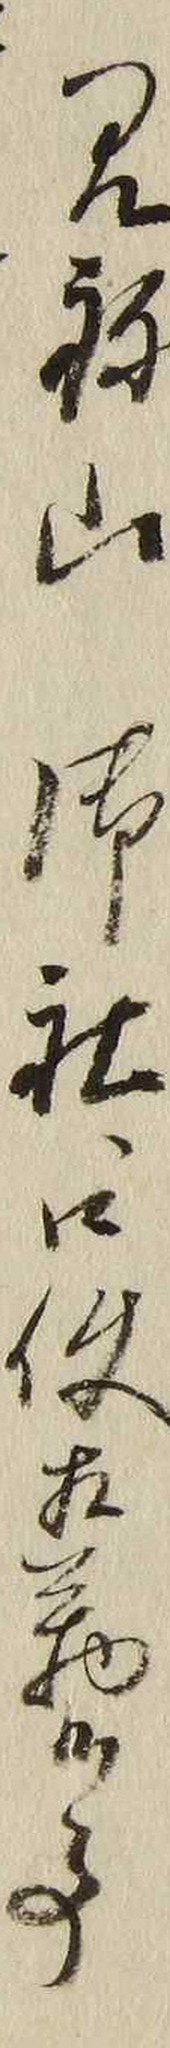見禰山御社へ御使相勤候事
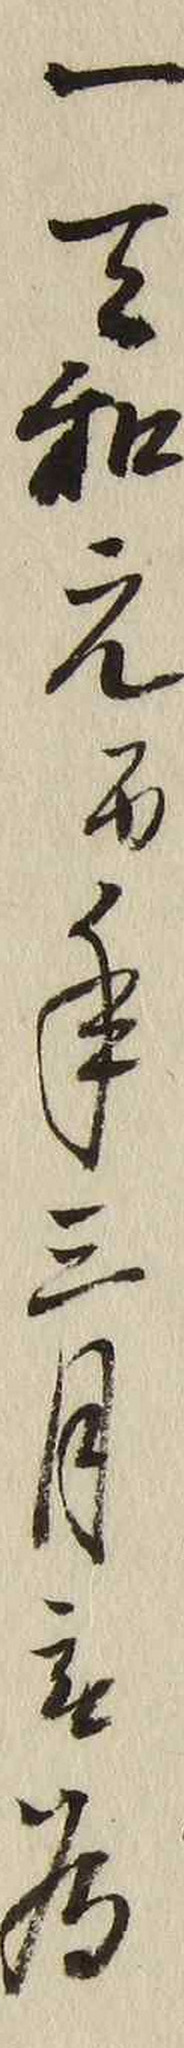一天和元酉年三月被為
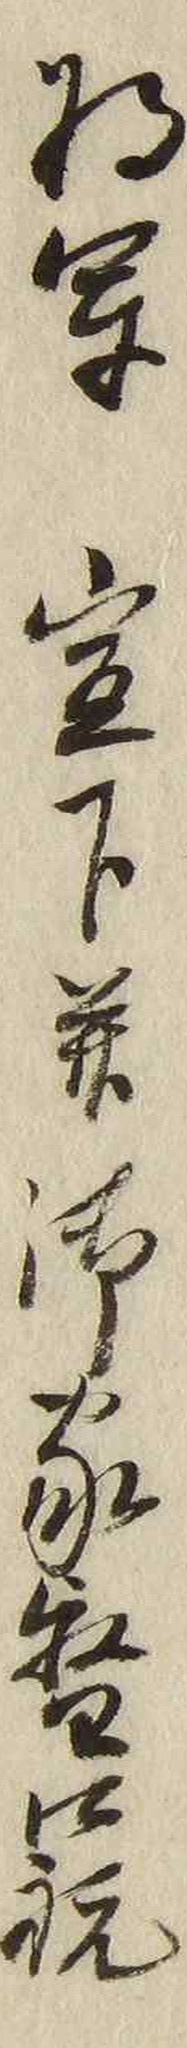将軍宣下并御家督御祝

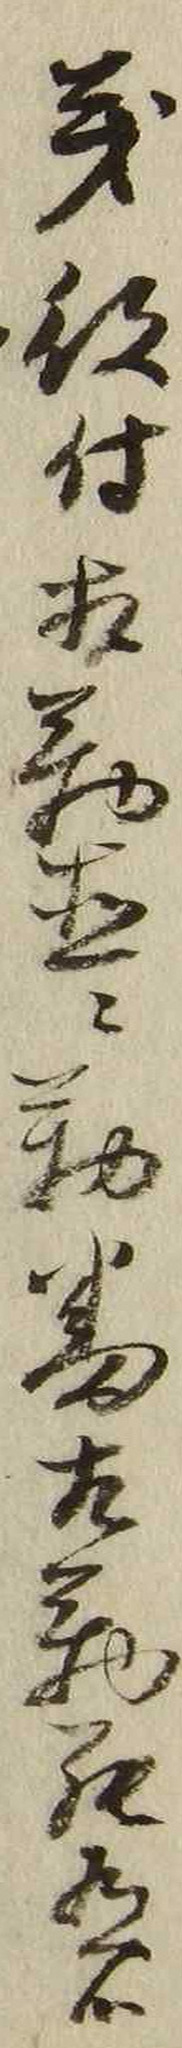義役付相勤直ニ勤番相勤罷有候
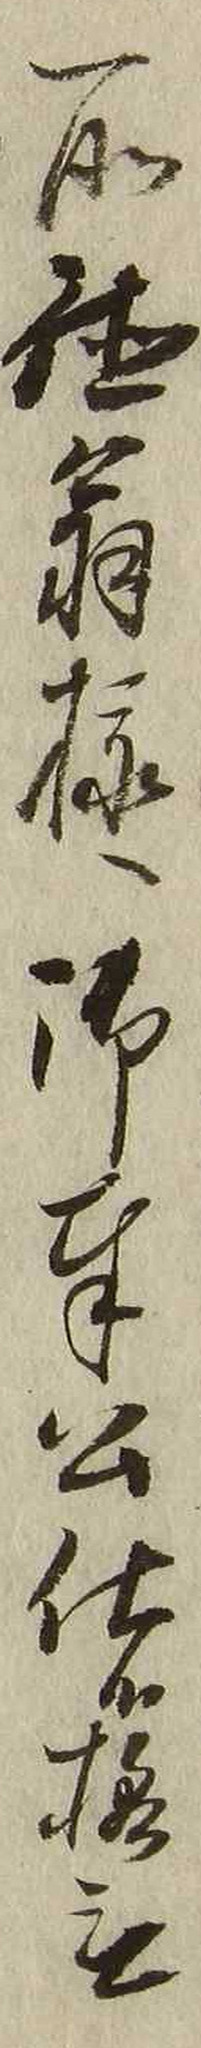所徳翁様へ御奉公仕候様被
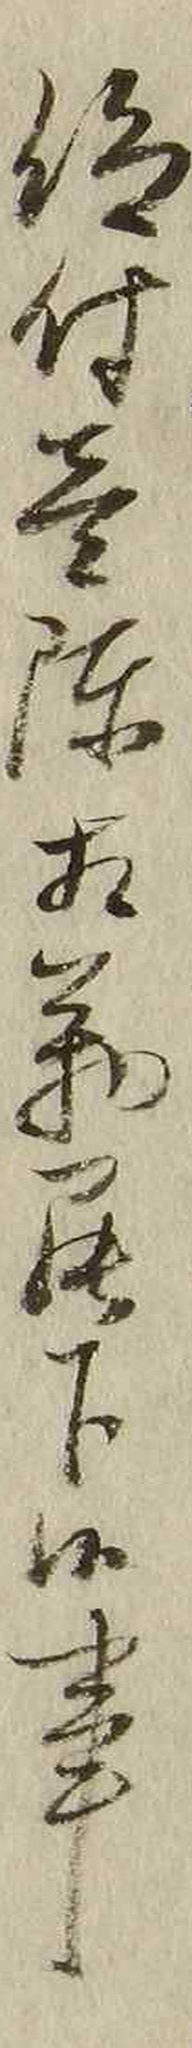仰付壱陣相勤居下候事
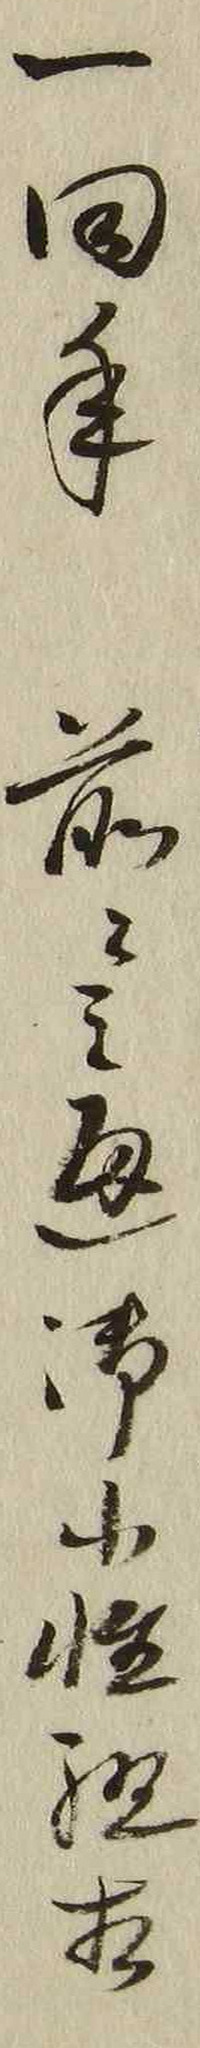一同年前々之通御小性組相
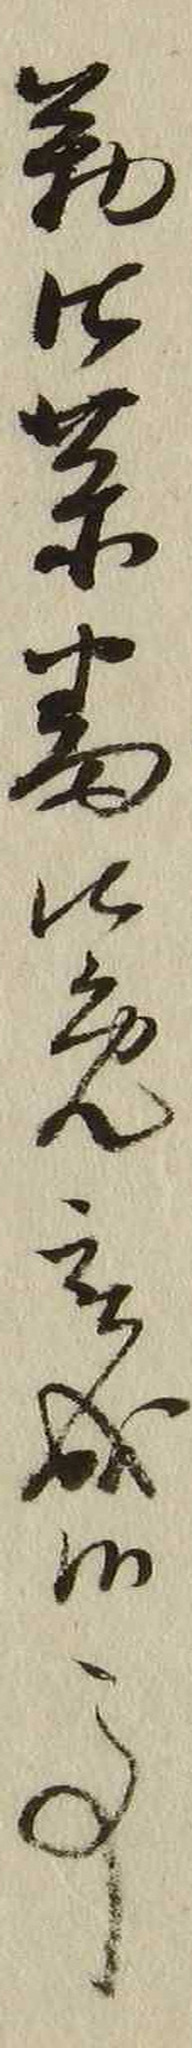勤御薬番御免被成候事
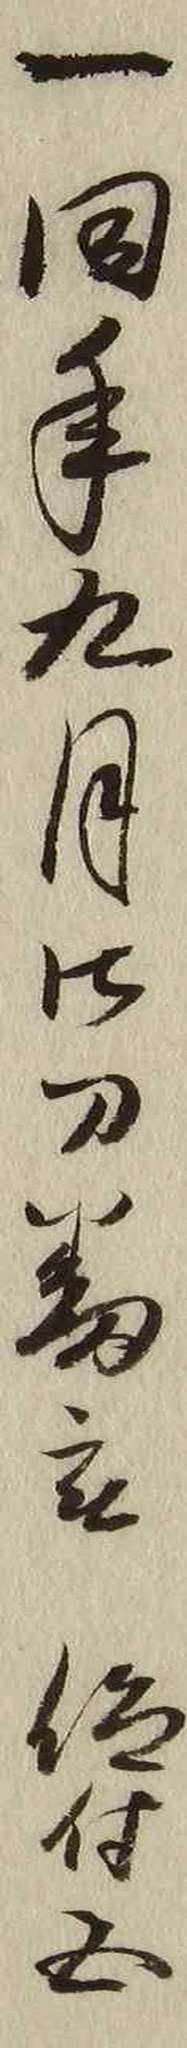一同年九月御刀番被仰付五
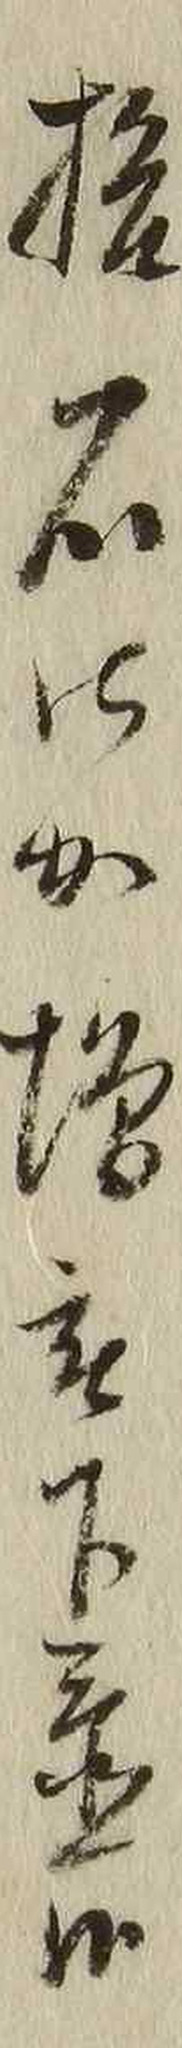拾石御加増被下置候
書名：諸士系譜　巻之355　す之部5
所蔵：会津若松市立会津図書館
